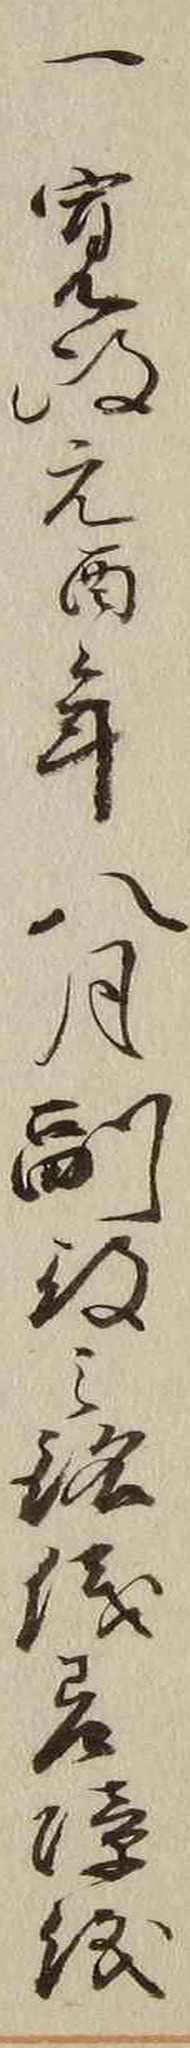一寛政元酉年八月副役之銘儀差障儀
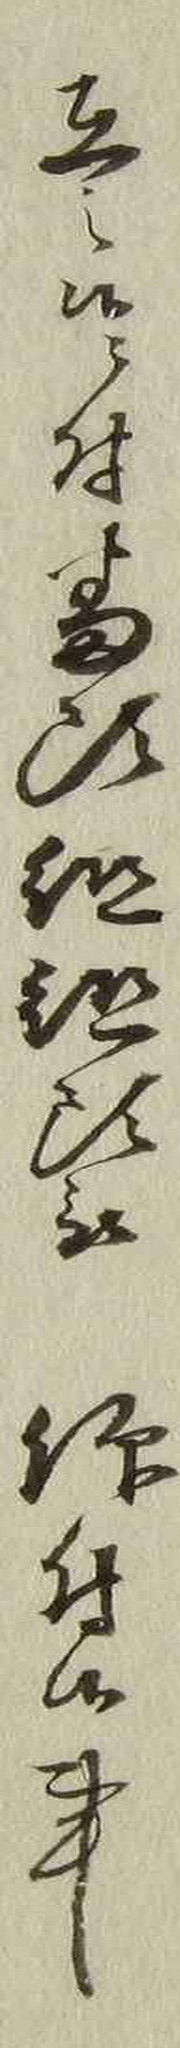在之候ニ付番頭組組頭被仰付候事
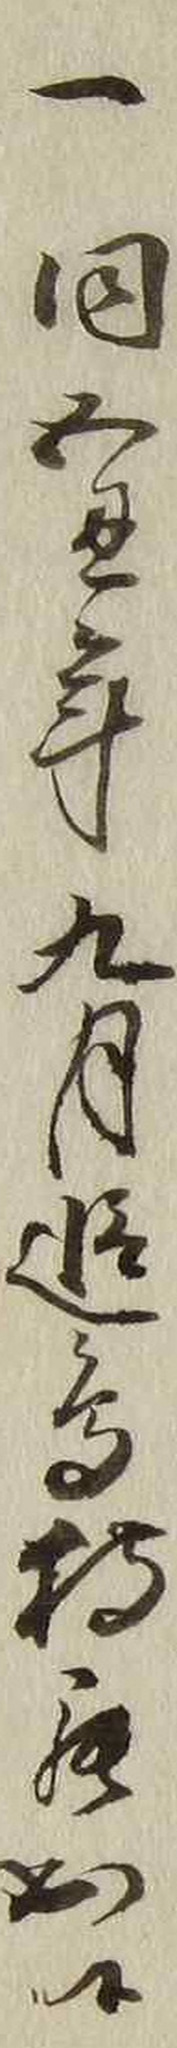一同五丑年九月追鳥狩罷出候
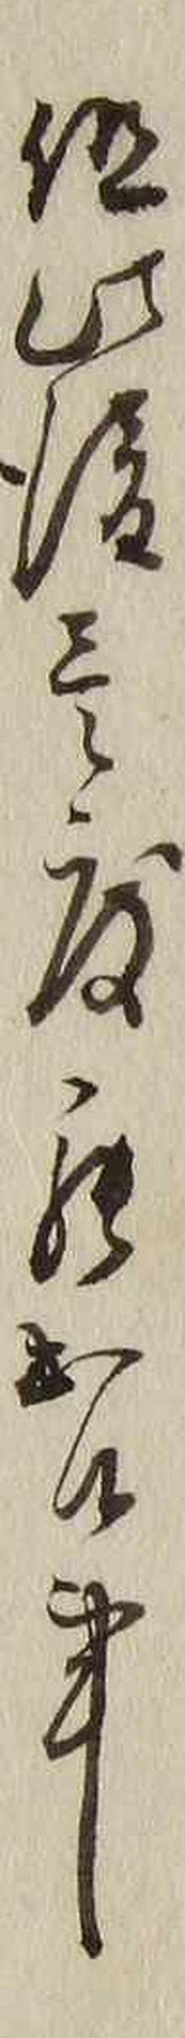但此後壱度罷出候事
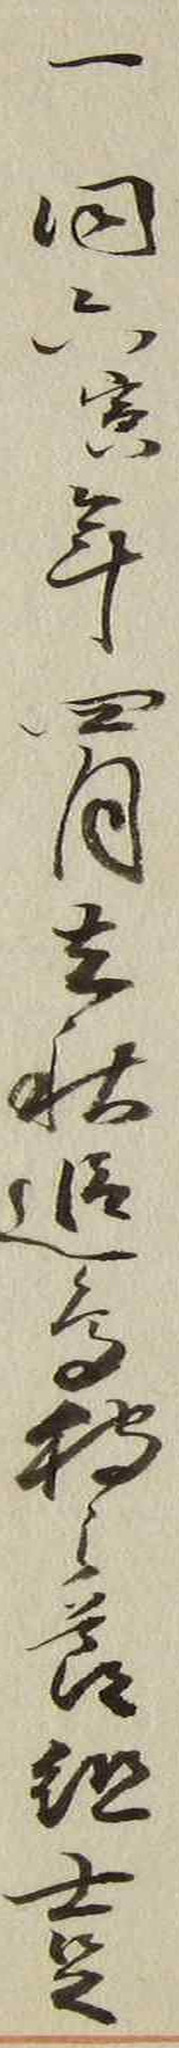一同六寅年四月去秋追鳥狩之節組士足
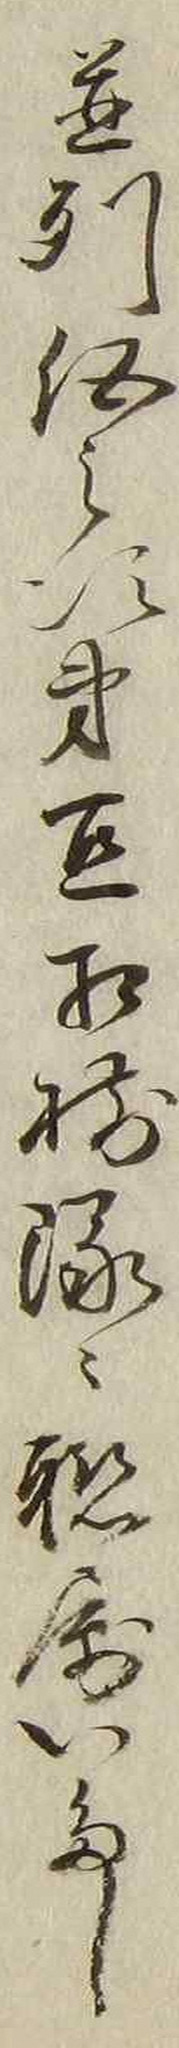並列伍之次第宜相揃隊々聯属いたし
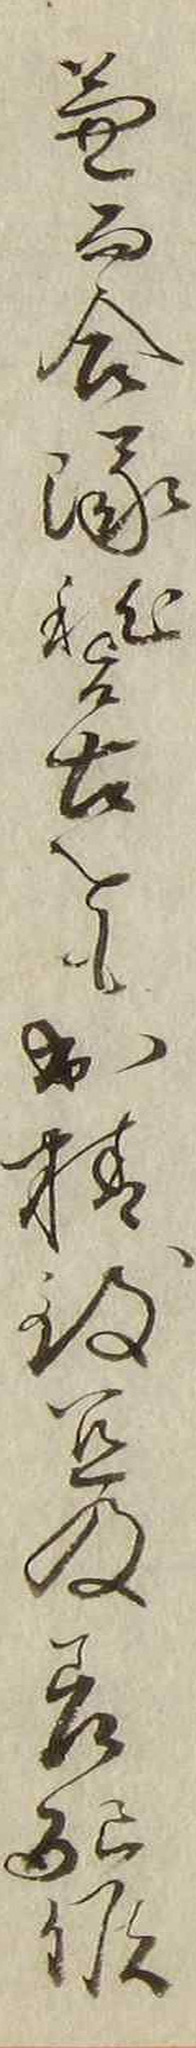兼而合隊稽古をも出精致宜及差配候

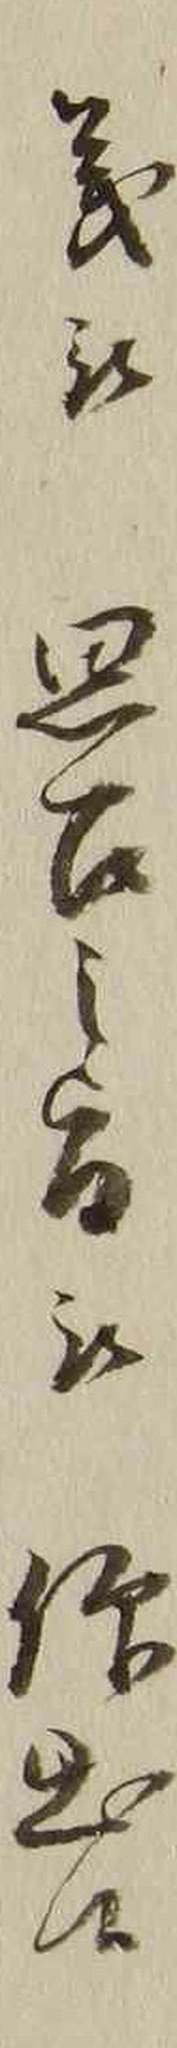義被思召之旨被仰出候
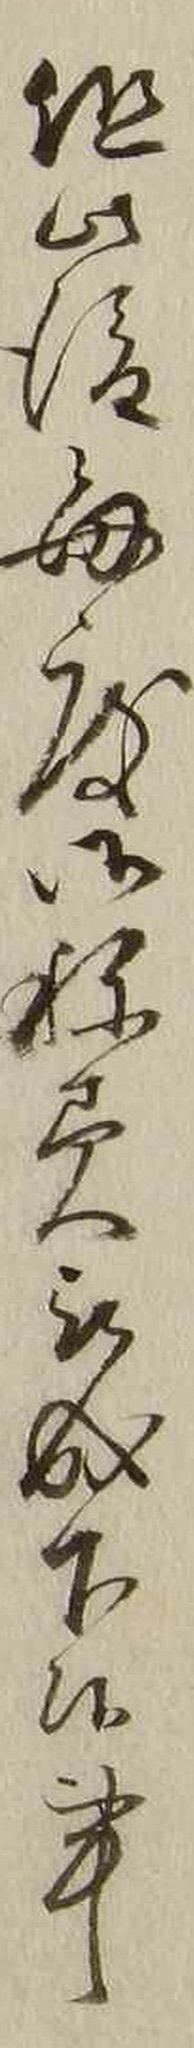但此後毎度御称美被成下候事
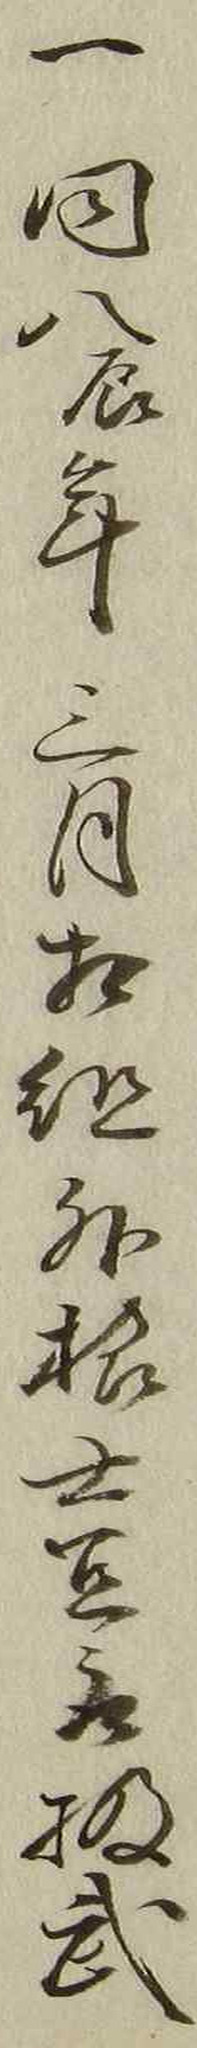一同八辰年三月相組外様士宜取扱武
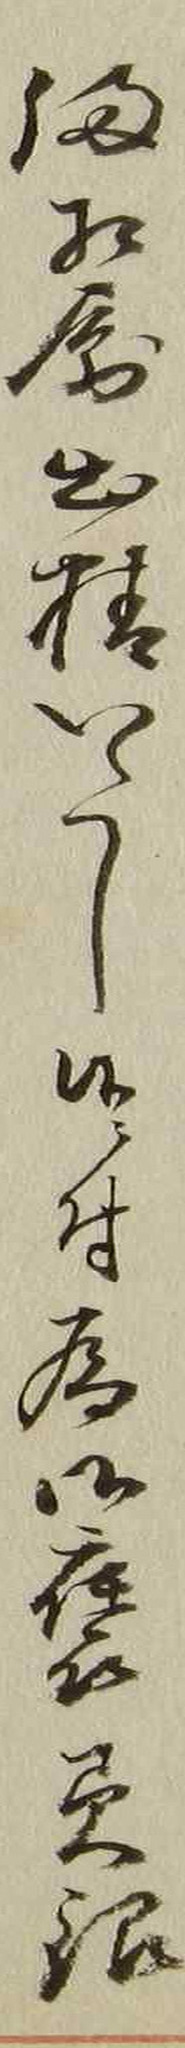備相属出様いたし候ニ付為御褒美銀
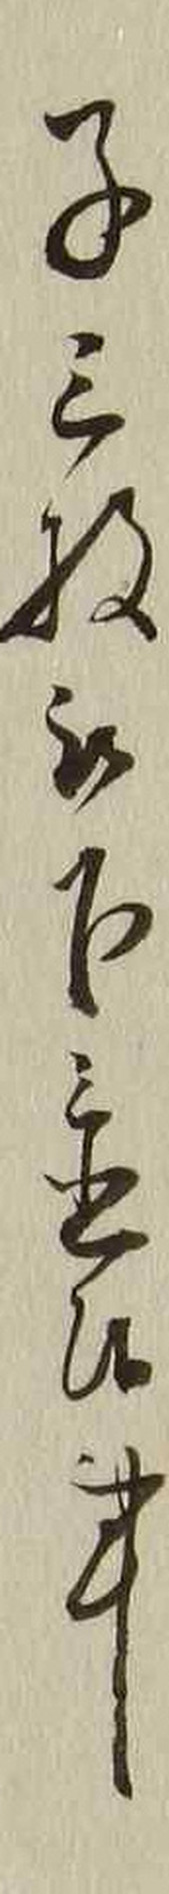子三枚被下置候事
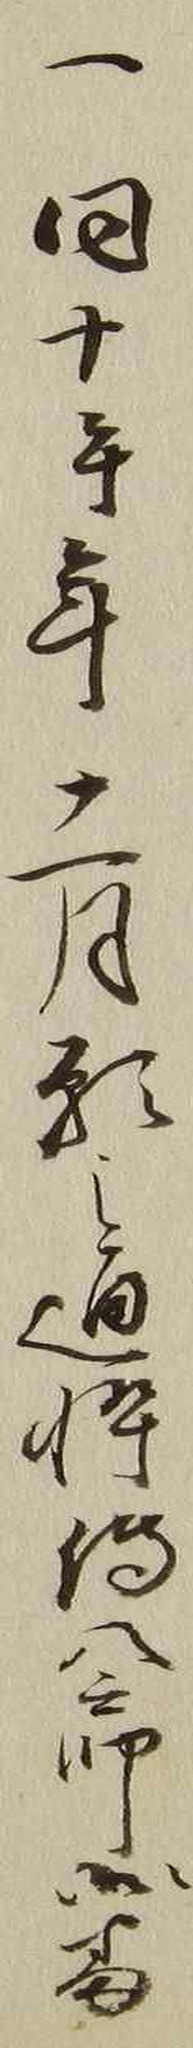一同十午年十一月願之通忰伝八郎御番
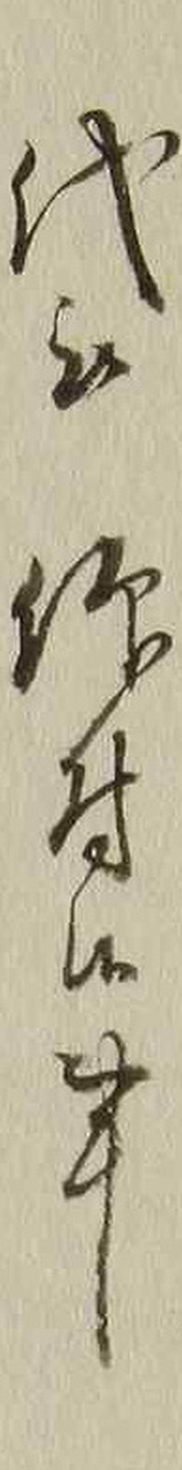代被仰付候事
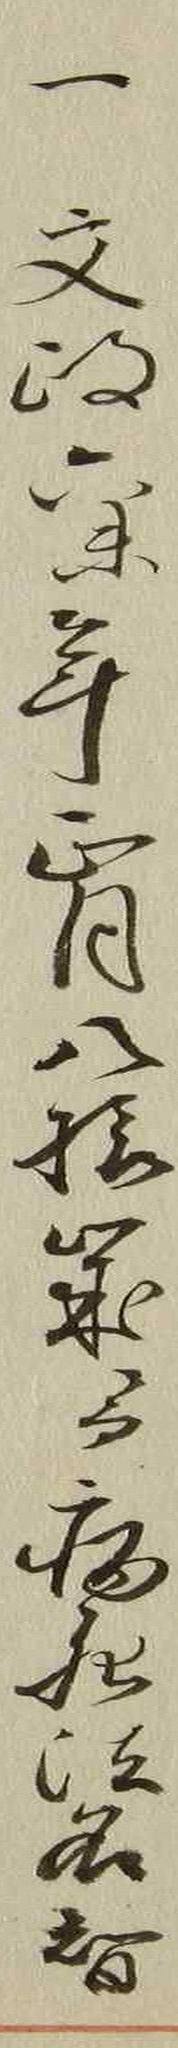一文政六未年正月八拾歳ニ而病死法名智
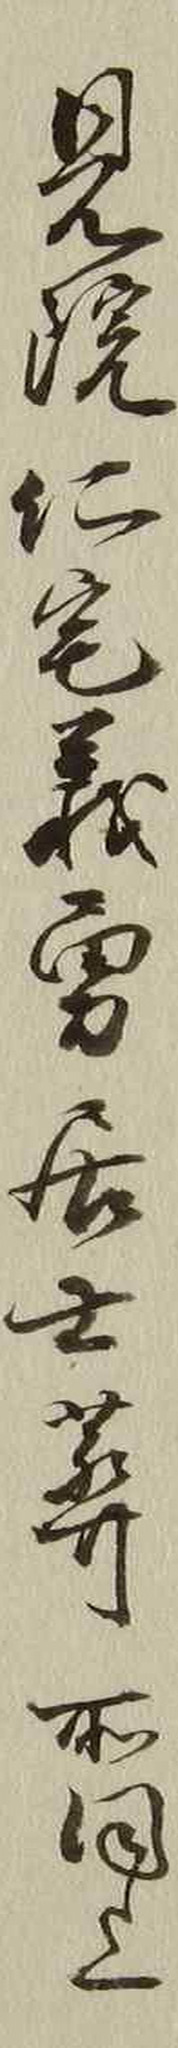見院仁宅義勇居士葬所同上
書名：諸士系譜　巻之122　よ之部5
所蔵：会津若松市立会津図書館
